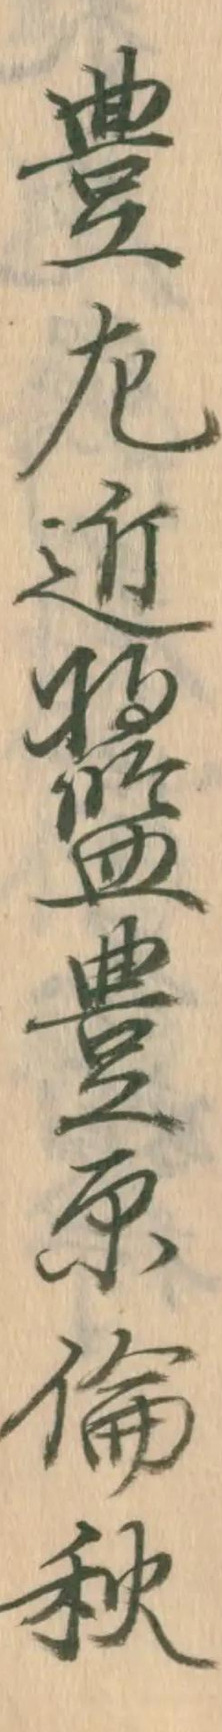豊左近将監豊原倫秋
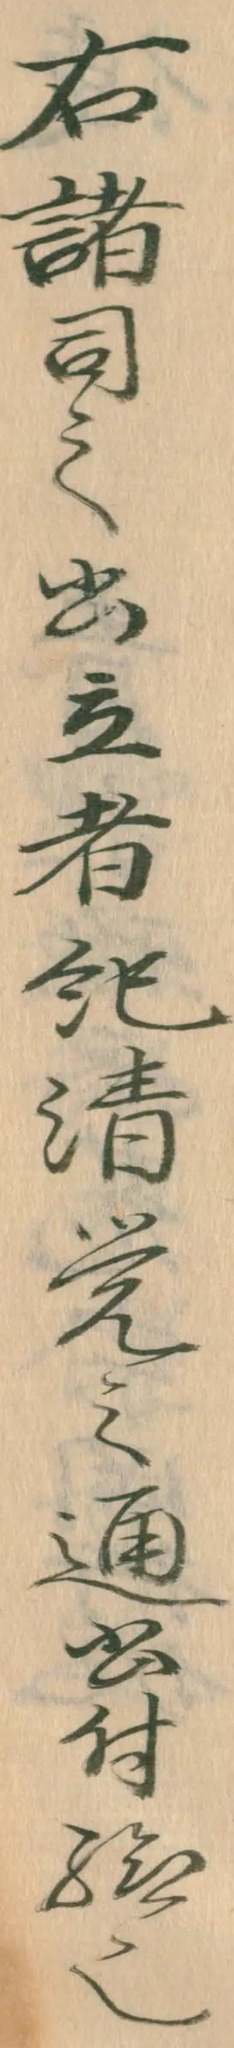右諸司之書立者紀清覚之通書付給也
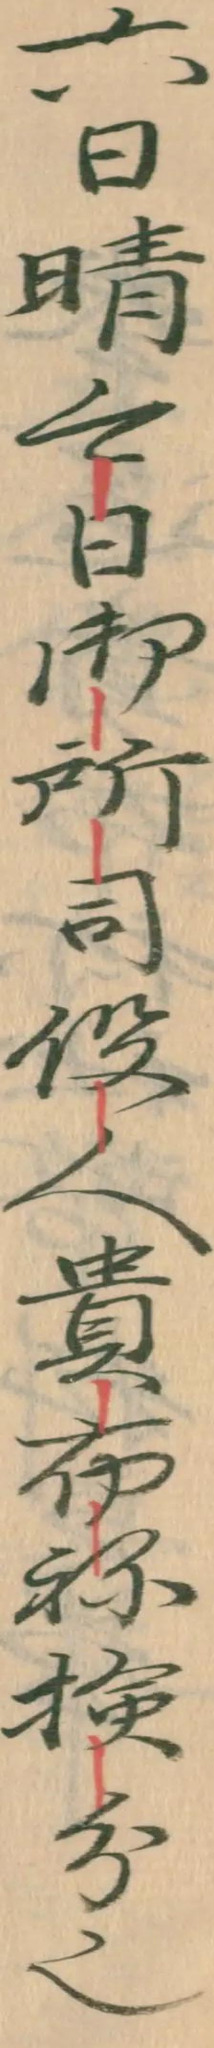六日晴今-日御-所-司役-人貴-布-祢検-分也
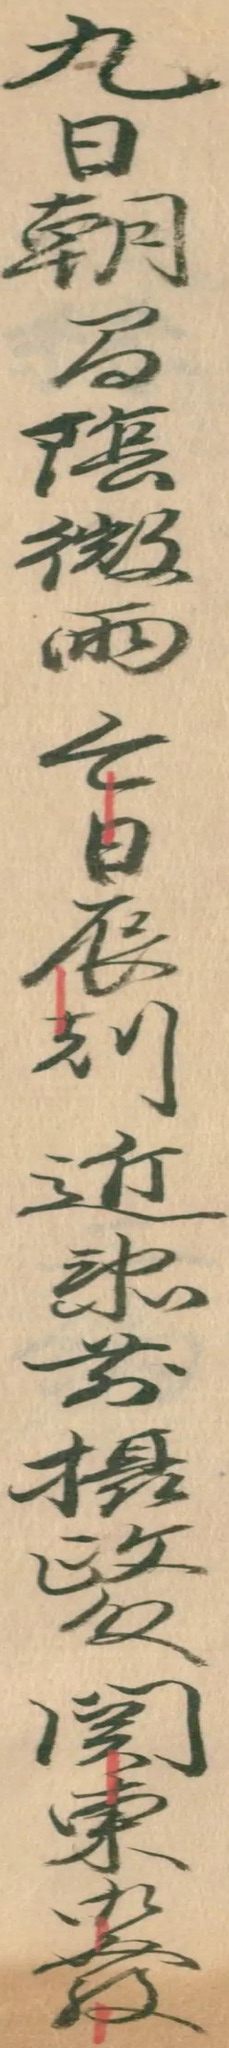九日朝間陰微雨今-日辰_刻近衛前摂政殿関-東御-発
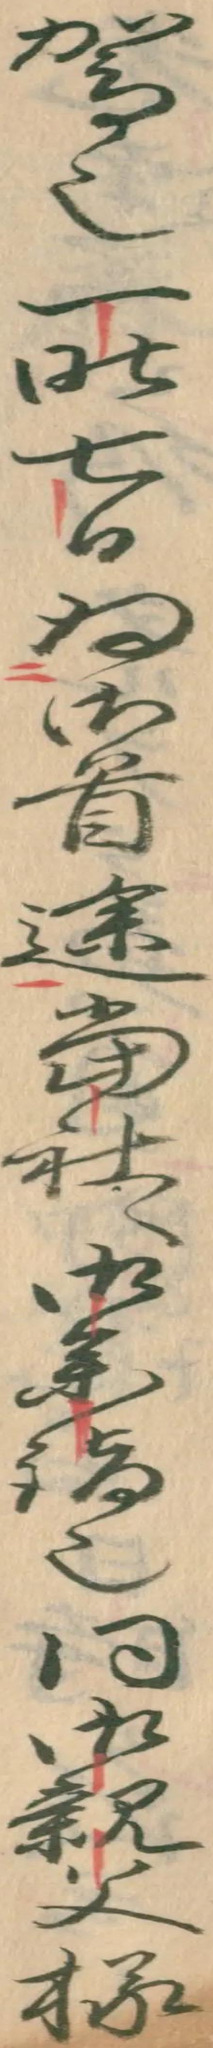駕也一-昨七_日為御首途当社へ御-参-詣也同御-親-父様
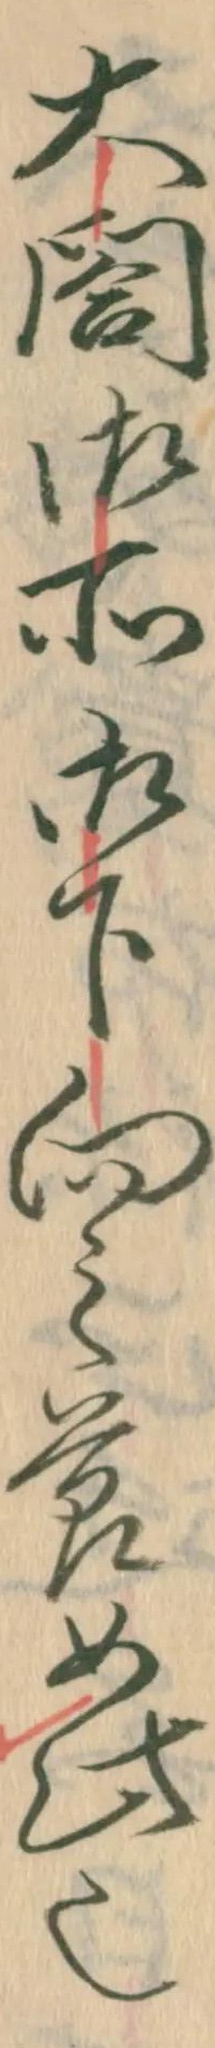大-閤御-所御-下-向之節如此也
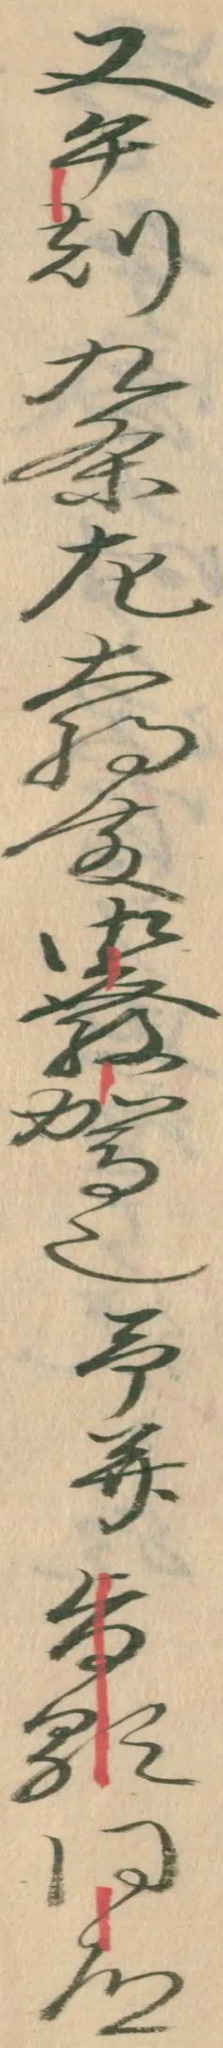又午_刻九条左大将殿御-発-駕也予并旨顕同-道

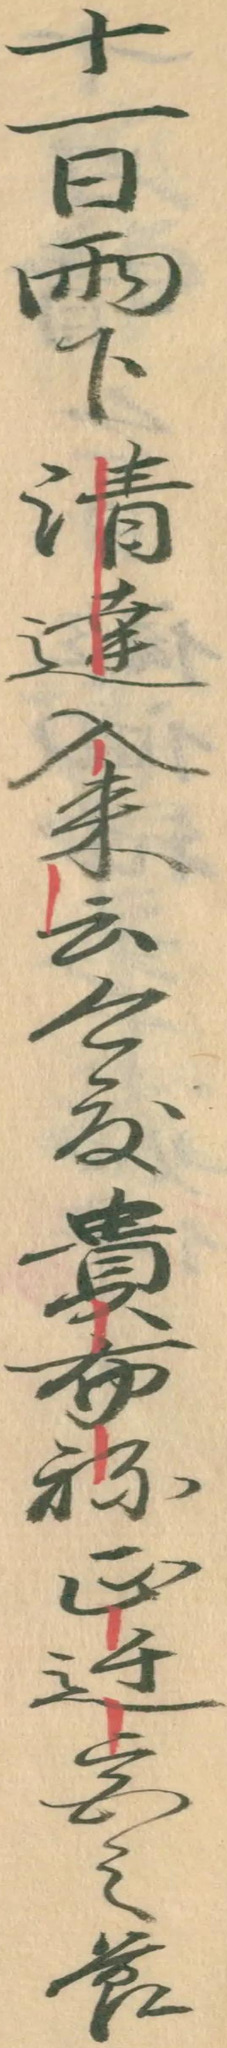十一日雨下清達入-来_云今度貴-布-祢正-迁-宮之節
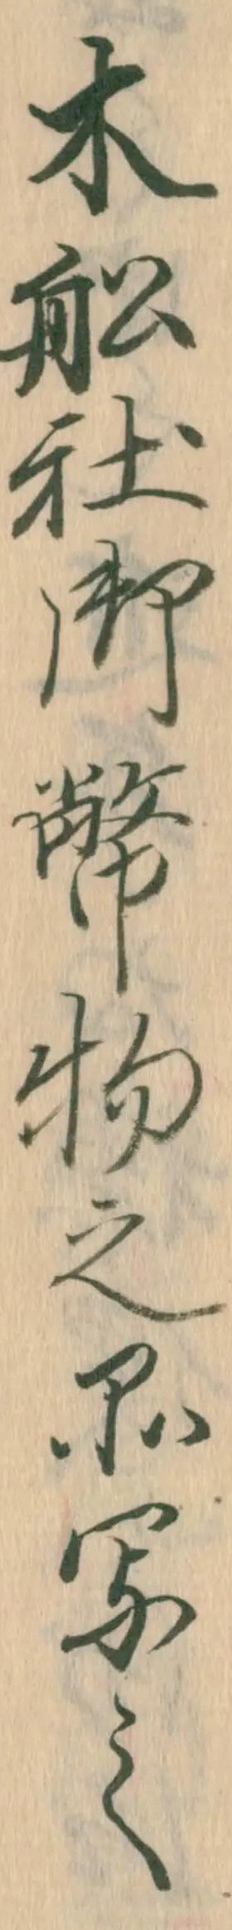木船社御幣物之品写之
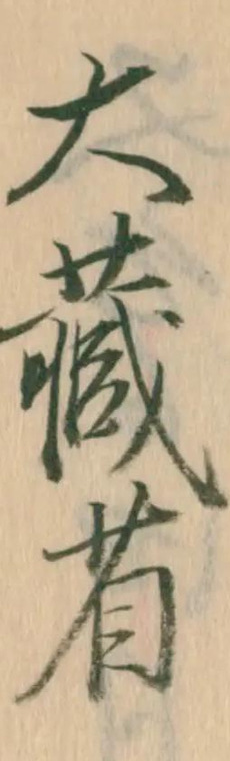大蔵省
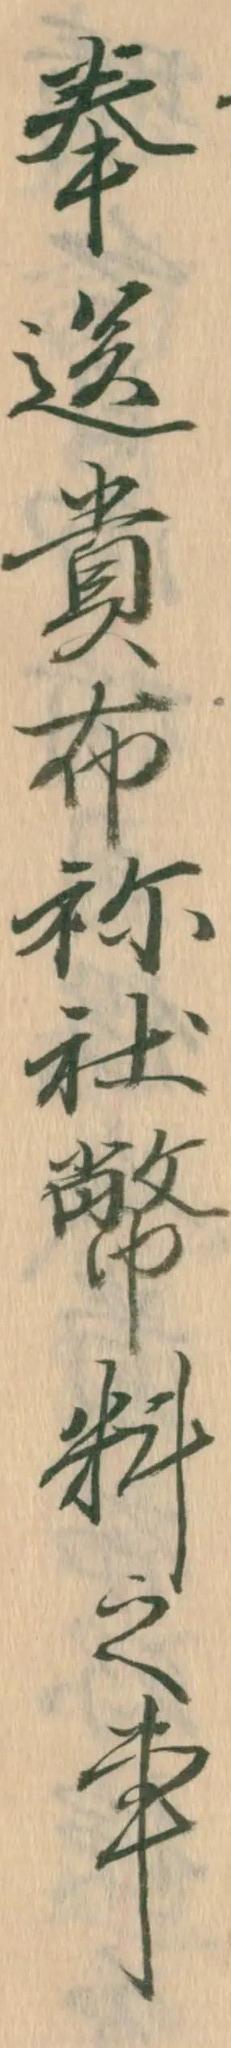奉送貴布祢杜幣料之事
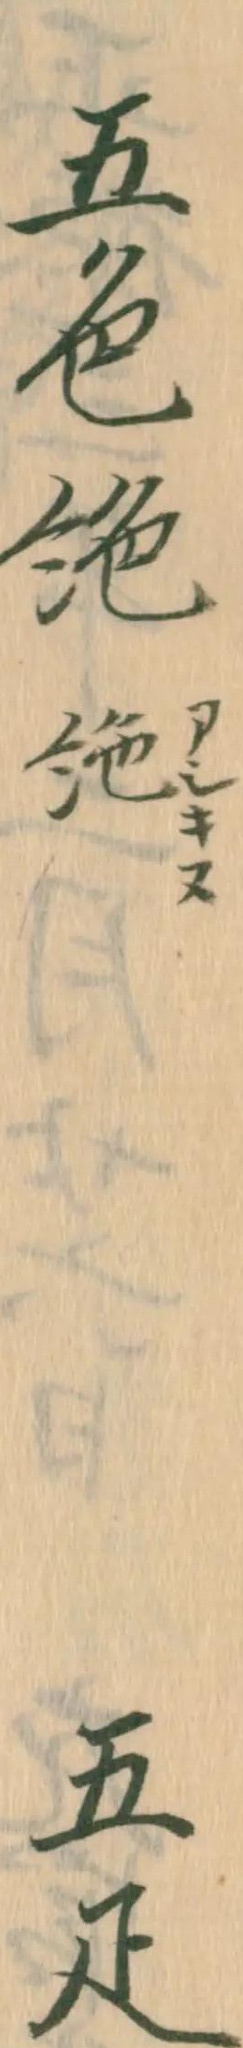五色絁絁五疋
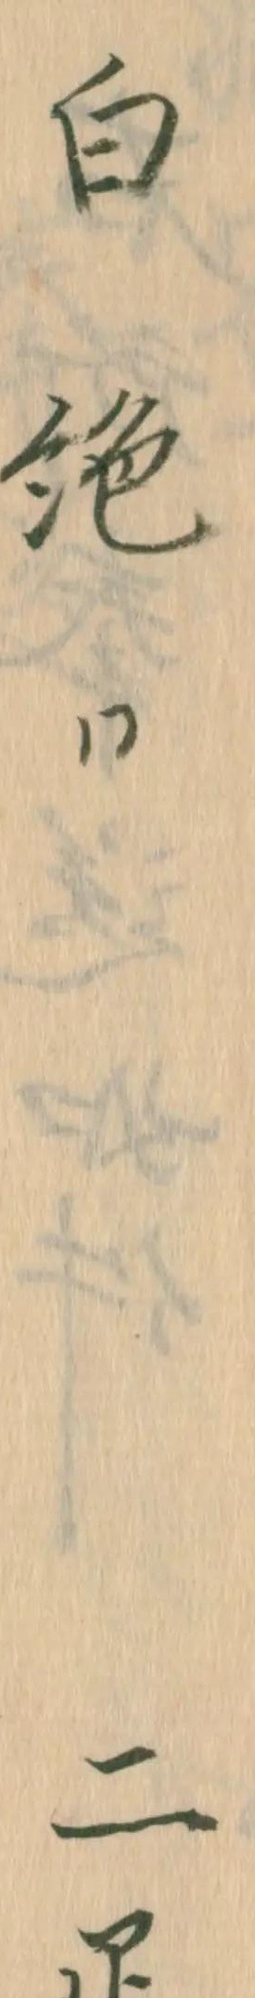白絁同二疋
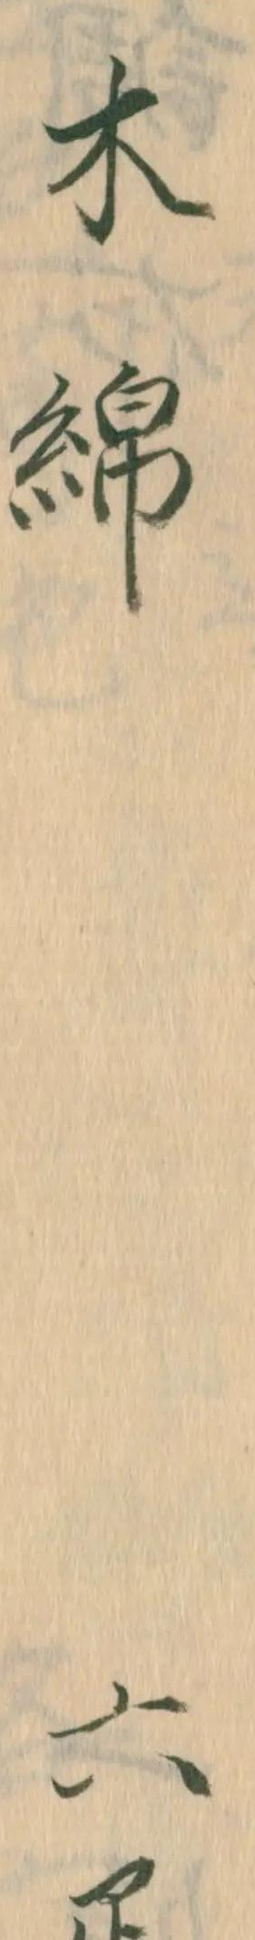木綿六疋
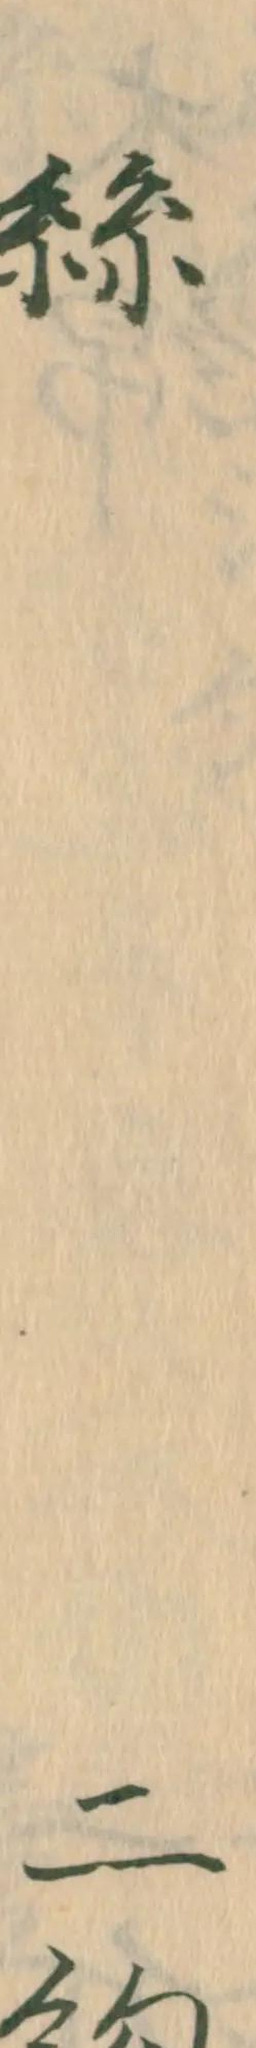絲二絇
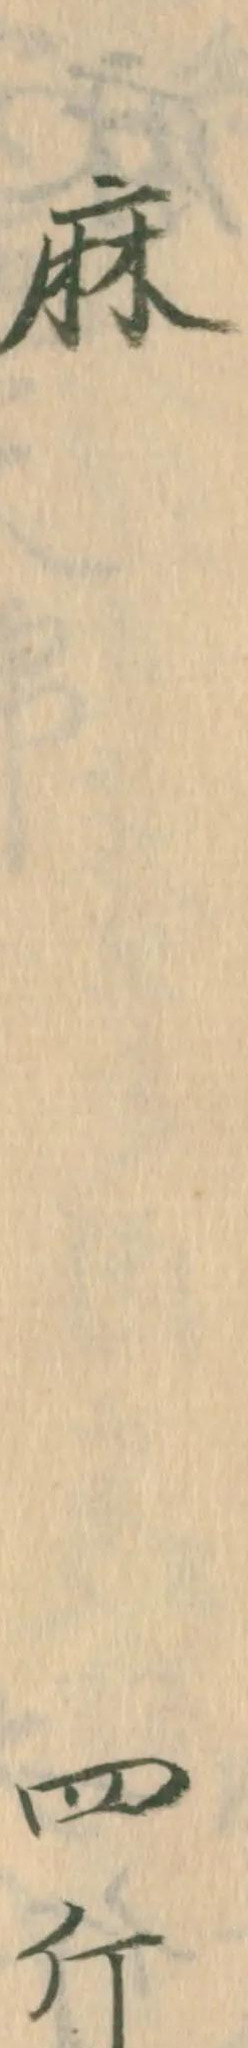麻四斤
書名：賀茂社記録. 第16冊
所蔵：国立国会図書館 National Diet Library, JAPAN
